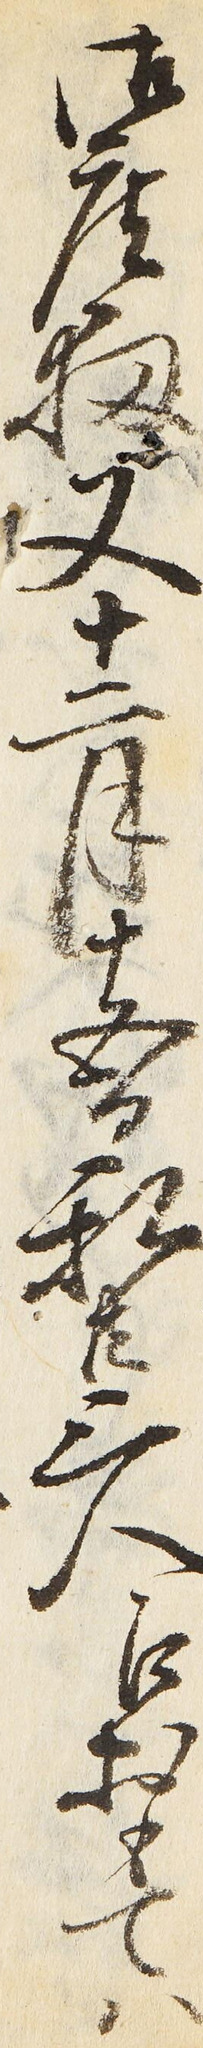御座扨又十二月十五日私共三人江おもてハ
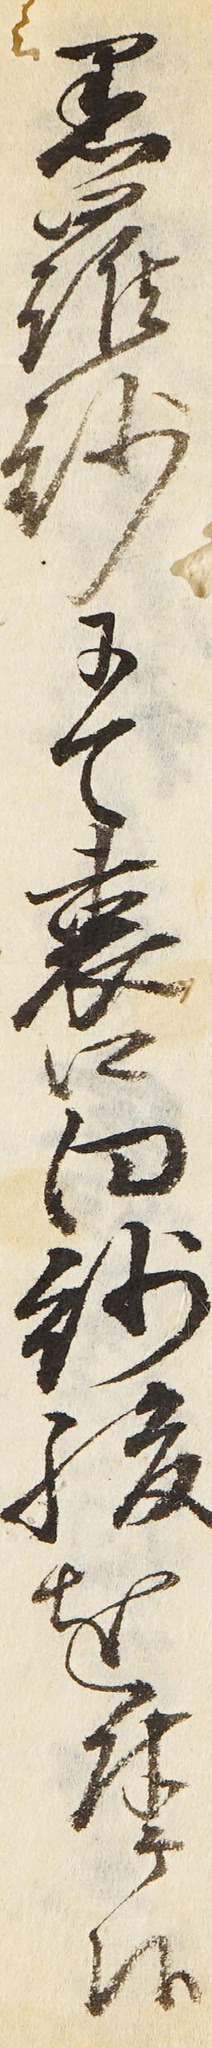黒羅紗にて裏江白紗綾を付ケ候
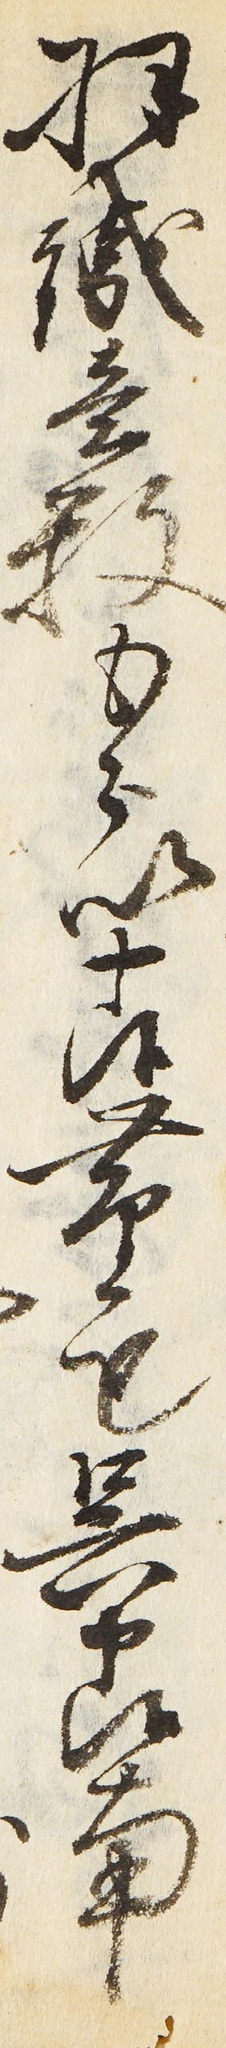羽織壱枚もらい申候帯も呉申候南
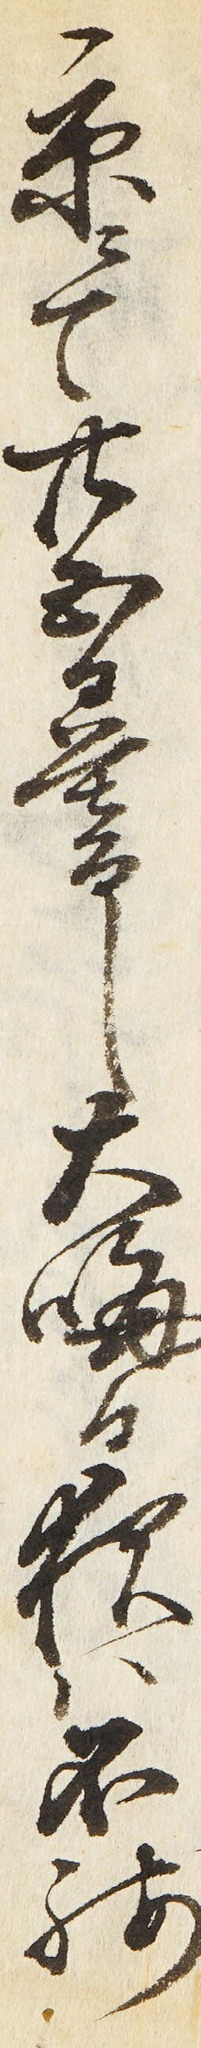京ニて廿五日暮し大晦日ハ不残
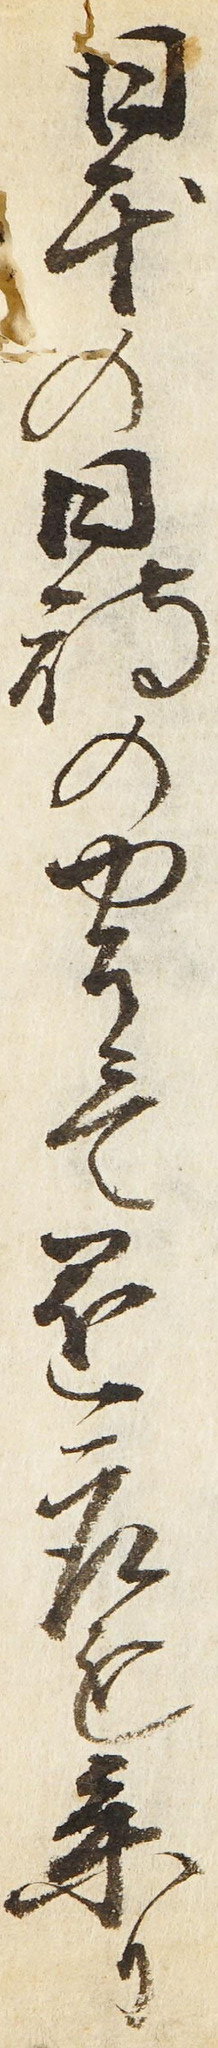日本の日待のやうニて懸取も参り
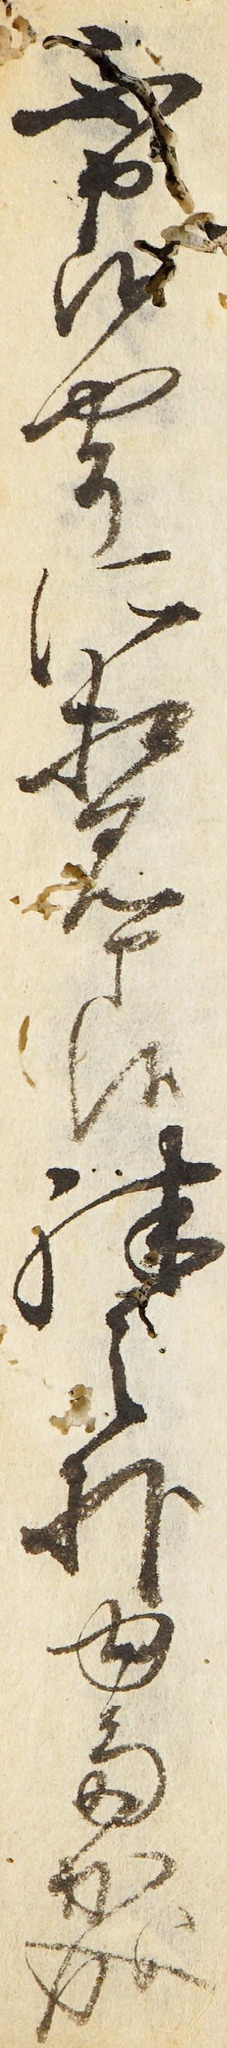不申候やうに相見申候殊之外ゆたか成

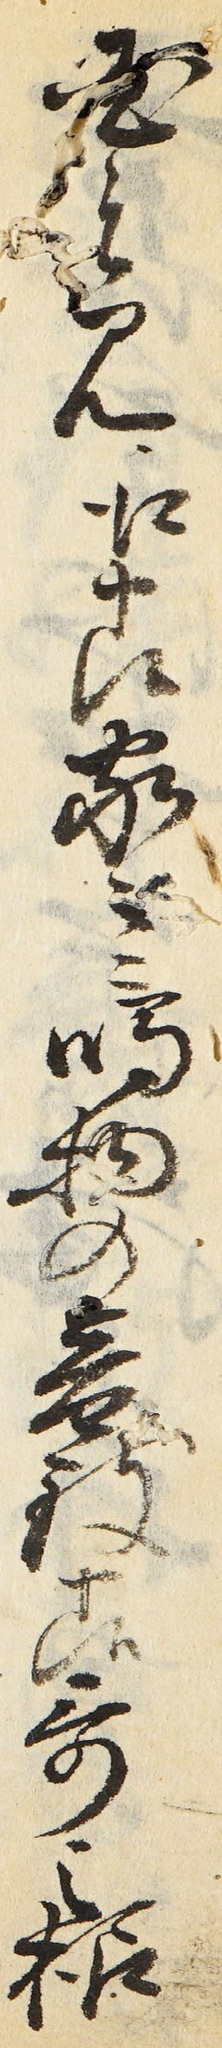国と見江申候家々ニ鳴物の音致申候哥之様
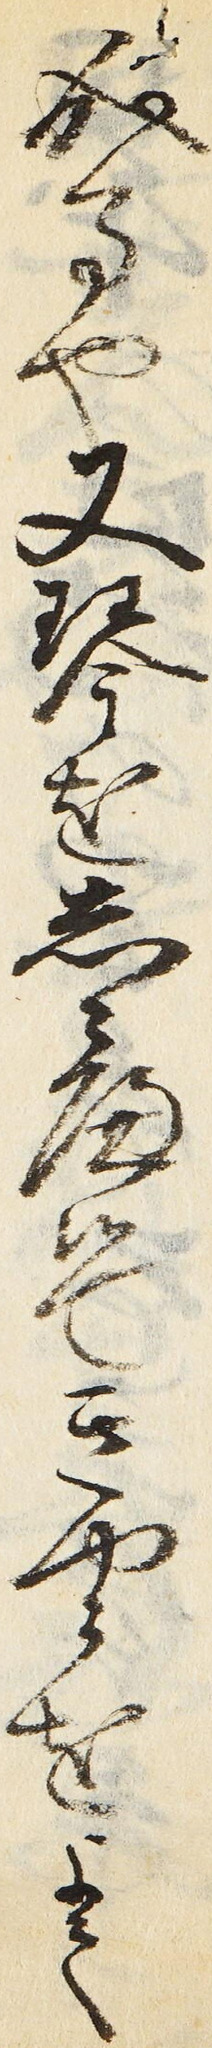成るや又琴をしらへ候てきやらをよて
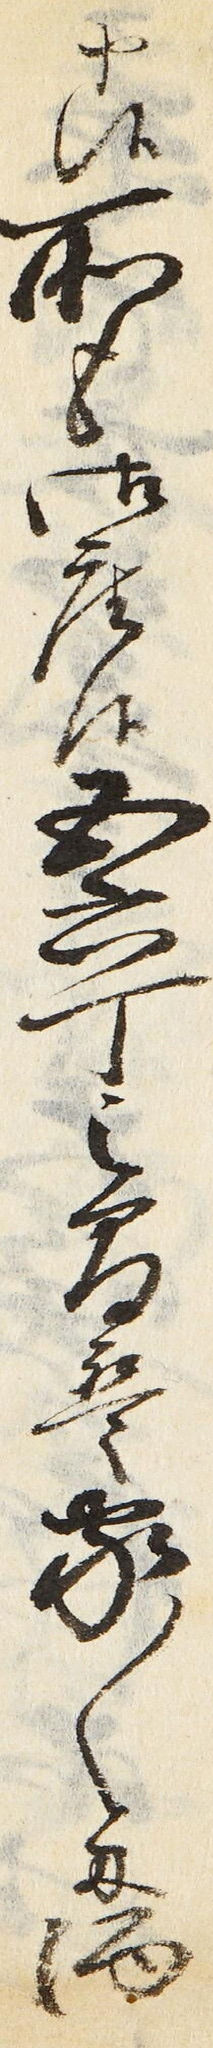申候所も御座候五六丁之間は家々に酒
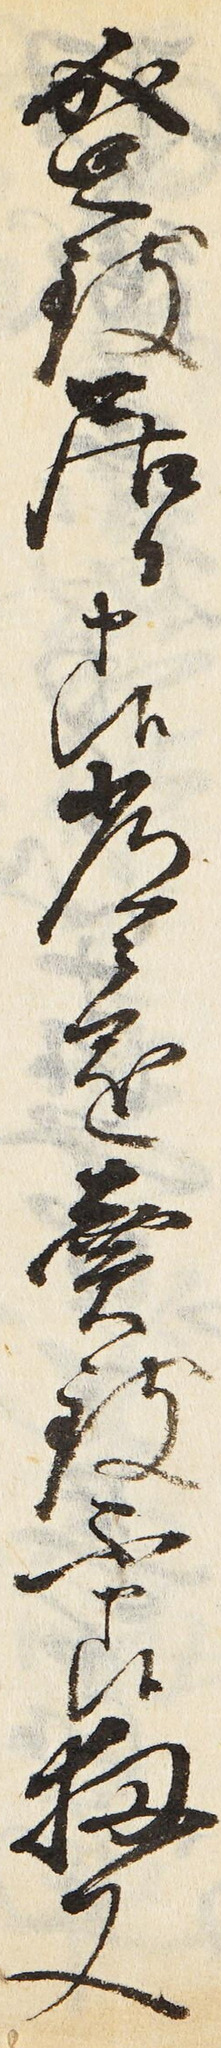盛致居り申候常々懸売致不申候扨又
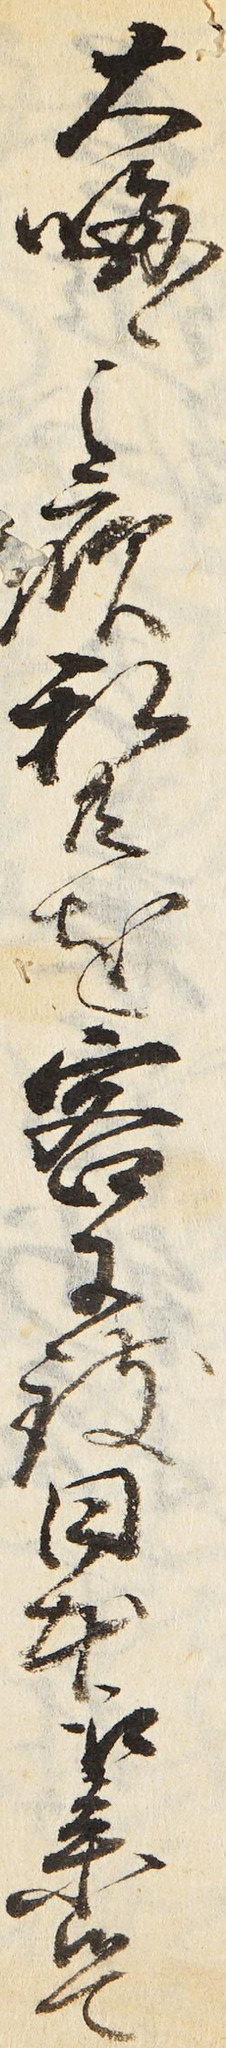大晦日之夜私共を客に致日本江参候て
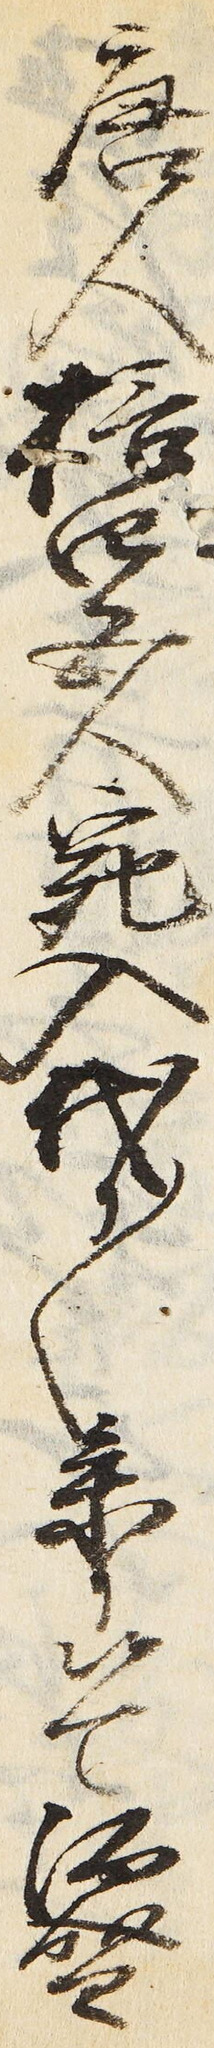唐人拾四五人宛入代り〳〵参候て酒盛
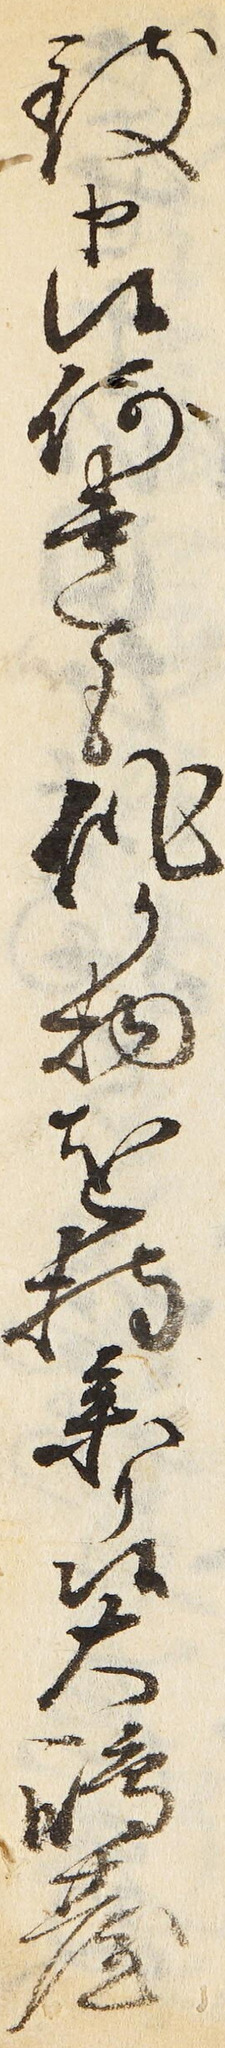致申候何れも作り物を持参り候大島台
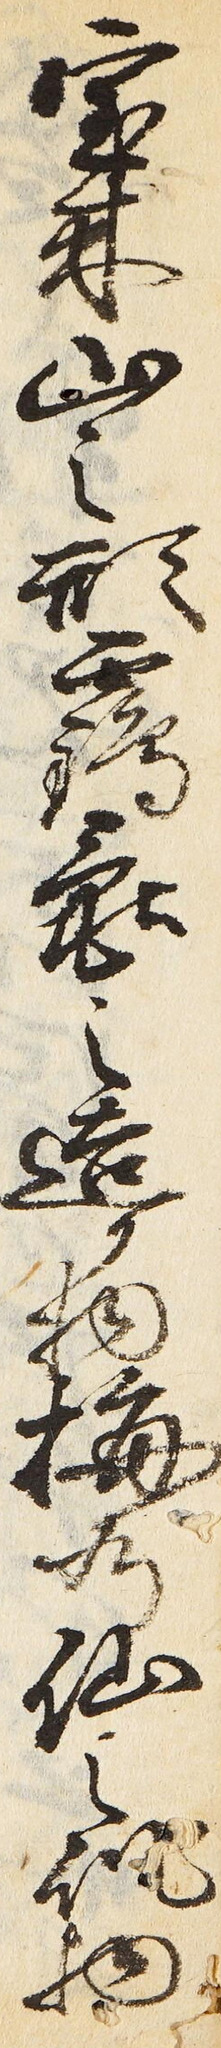宝来山之形鶴亀之造り物梅水仙之作物
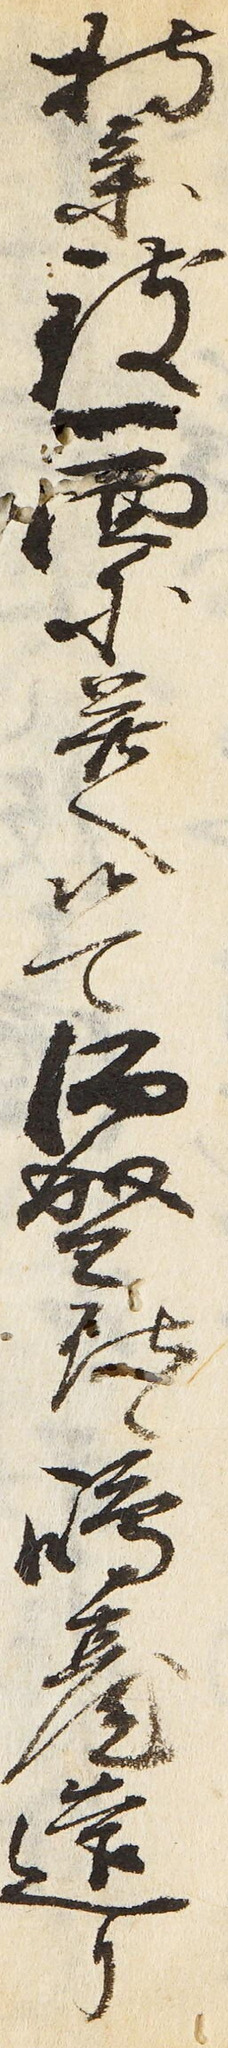持参致一面に幷べ候て酒盛致候島台造り
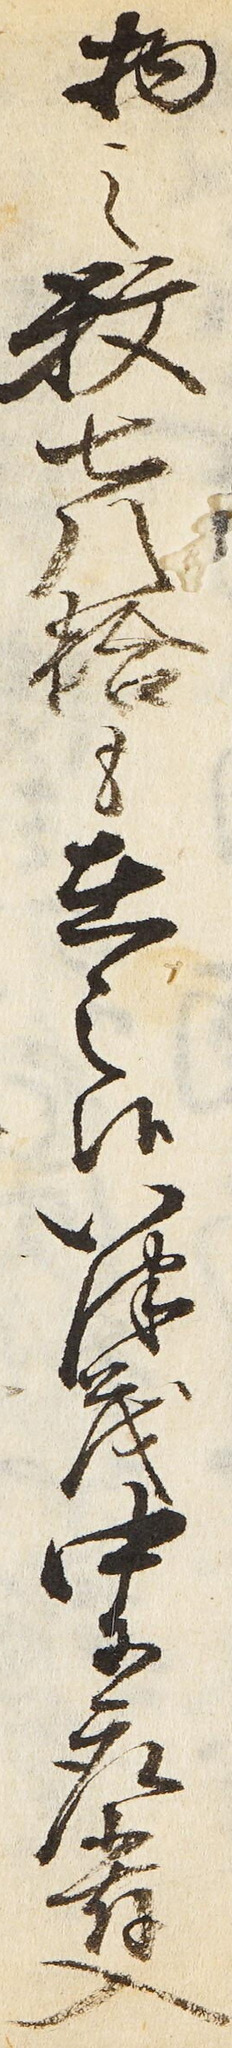物之数七八拾も在之候いつ茂中に差肴入
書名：志州鳥羽船頭外国江吹流し候一件
